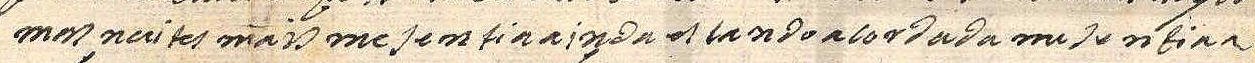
mas noites mais me sentia ainda estando acordada me sentia a
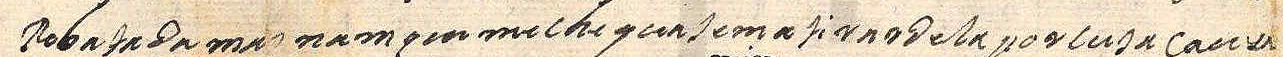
Rebatada mas nam que me cheguasem a tirar dela por cuja cauza
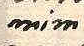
mim
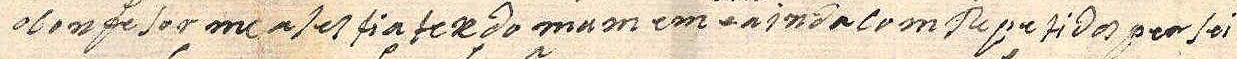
o confesor me asestia tendo mam em e ainda com Repetidos persei
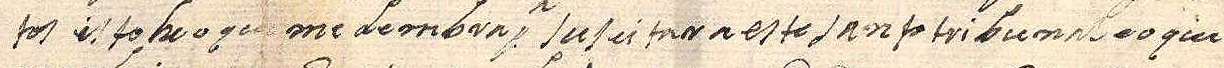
tos isto he o que me Lembra pa sujeitar a este santo tribunal e o que
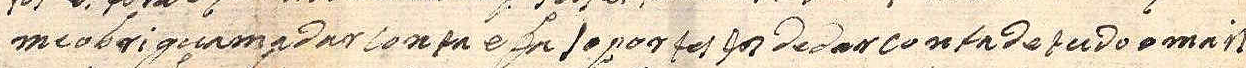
me obriguam a dar conta e faso por testos de dar conta de tudo o mais
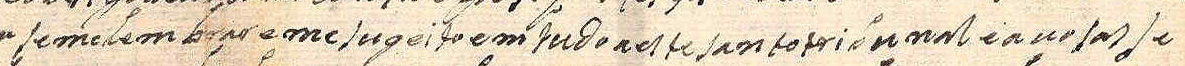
se me lembrar e me sugeito em tudo a este santo tribunal e a uosas se
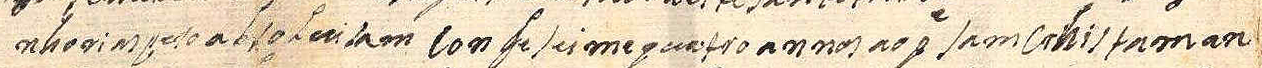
nhorias peso absoLuisam confeseime quatro annos ao pe samcrhistam an
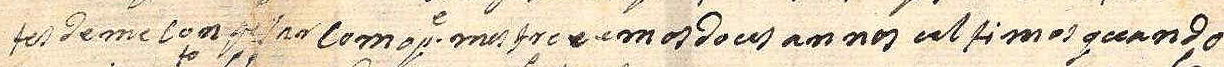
tes de me confesar com o p.e mestre e em os dous annos ultimos quando
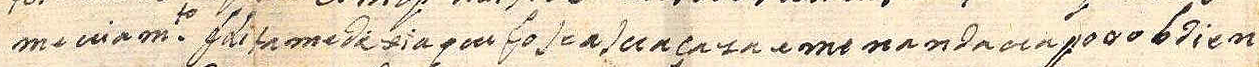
me uia m.to flita me dizia que fose a sua caza e me mandaua por obdien
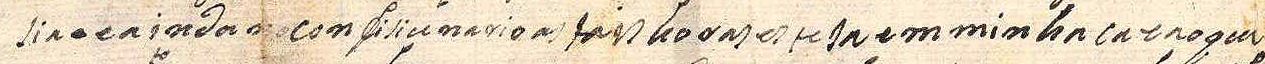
sia o e ainda no confisiunario as tais horas esteja em minha caza o que
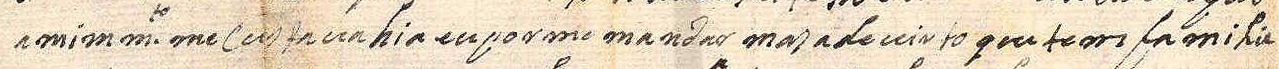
a mim m.to me Custaua hia eu por me mandar mas adeuirto que tem familia
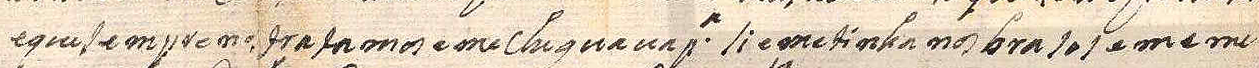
e que sempre no tratamos e me cheguaua p.a si e me tinha nos brasos e me me
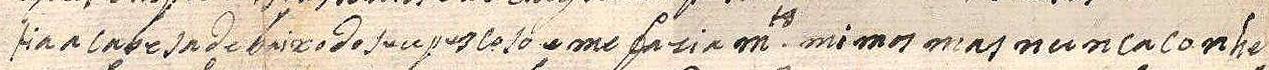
tia a cabesa debaixo do seu pescoso e me fazia m.tos mimos mas nunca conhe
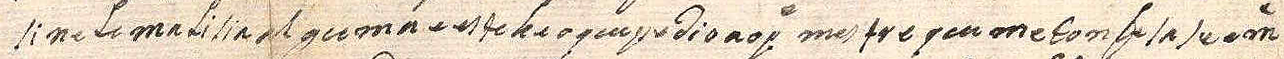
si nele malisia alguma e este he o que pedio ao pe mestre que me confesase e me
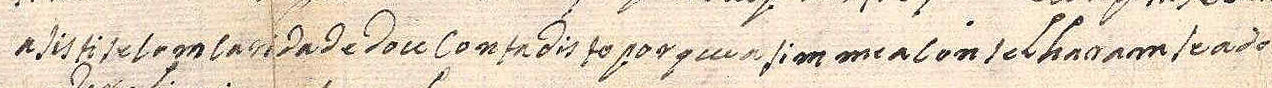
asistise com caridade dou conta disto porque asim me aconselharam se a de
